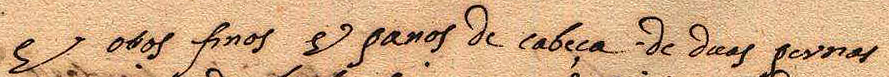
E otros finos E panos de cabeça de duas pernas
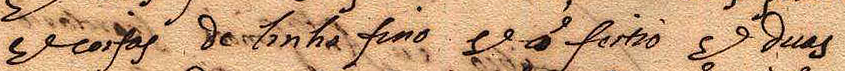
E costas de linho fino E cō feitio E duas
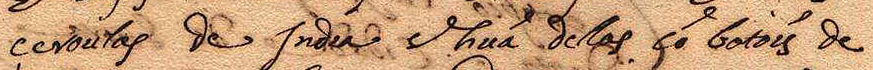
ceroulas de Jndia E huā dellas cō botois̄ de
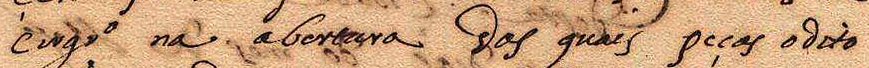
cirgro na abertura das quais peças o dito
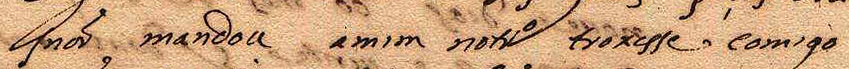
snor̄ mandou a mim notro troxesse comigo
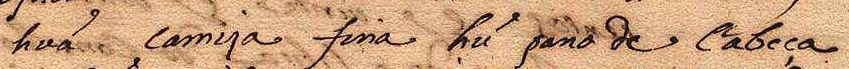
huā camiza fina hū pano de Cabeça
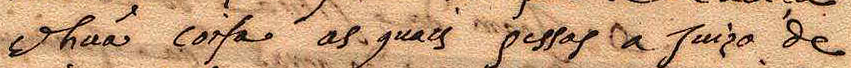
E huā coifa as quais pessas a Juizo de
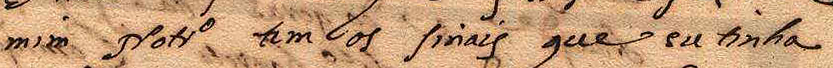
mim Notro tem os sinais que Eu tinha
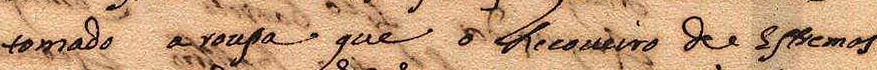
tomado a roupa que o Recoueiro de Estremos
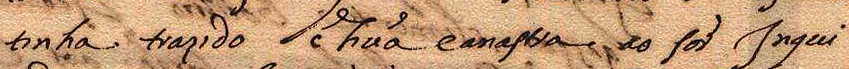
tinha trazido e huā canastra ao sor̄ Jnqui
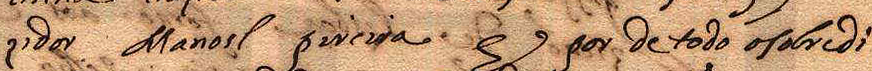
zidor Manoel pereira E por de todo o sobredi
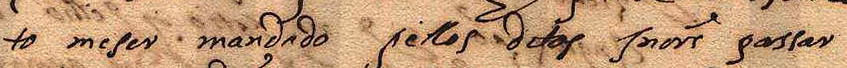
to me ser mandado pellos ditos snors̄ passar
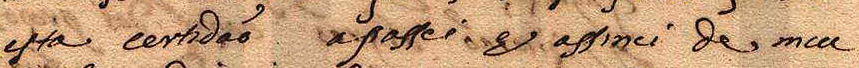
esta certidaõ a passei E assinei de meu
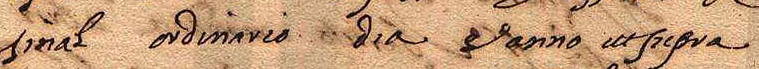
sinal ordinario dia E anno ut supra
